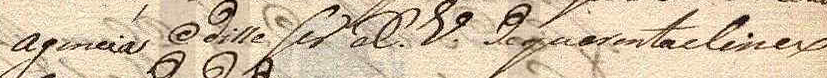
agencia e disse ser X.V. de quarenta e Cinco
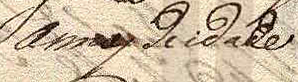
annos de idade
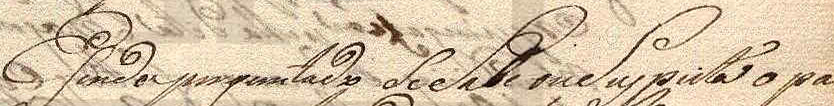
E sendo perguntado se sabe ou suspeita o pa
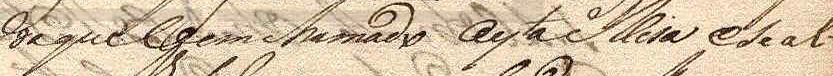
ra que vem chamado a esta Mesa e se al
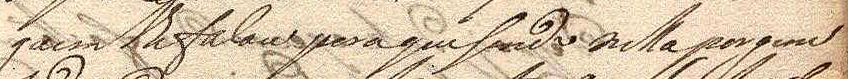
guem lhe falou pera que sendo nella pergun
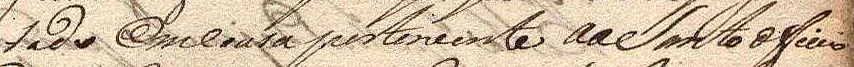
tado em cousa pertencente ao Santo officio
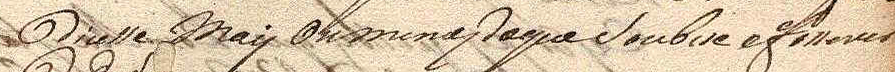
dicesse mais ou menos do que soubese e fosse ver
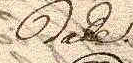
dade.
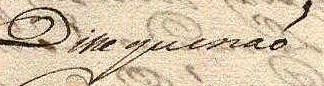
Disse que naõ
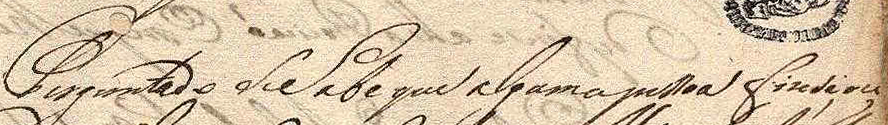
Perguntado se Sabe que alguma pessoa fizese, ou
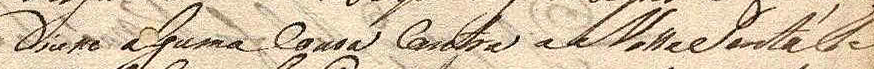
dicesse alguma Cousa Contra a Nossa Santa Fe
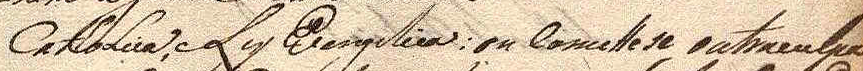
CathoLica, e Ley Euangelica: ou Comettese outra culpa
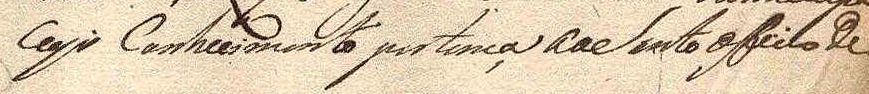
cuyo Conhecimento pertença ao Santo officio de
